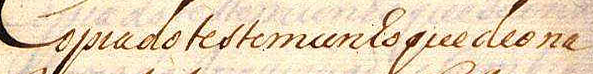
Copia do testemunho que deo na
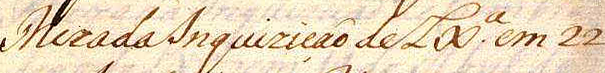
Meza da Inquiziçaõ de Lx.a em 22
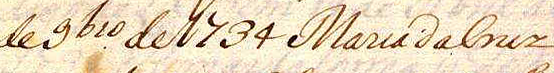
de 9bro. de 1734 Maria da Cruz
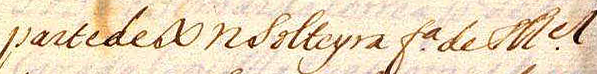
parte de x n Solteyra f.a de M.el
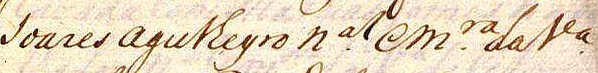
soares agulheyro n.al e m.ra da V.a
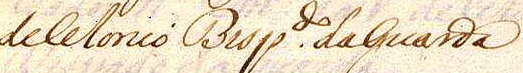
de Celorico Bisp.do da Guarda
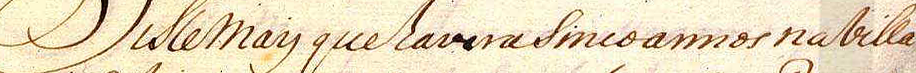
Disse mais que havera sinco annos na Villa
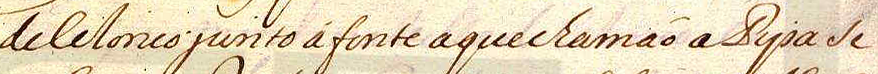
de Celorico junto á fonte a que chamaõ a Pipa se
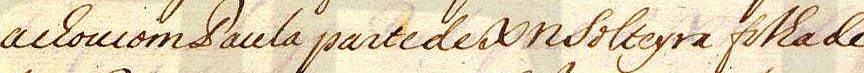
achou com Paula parte de xn Solteyra filha de
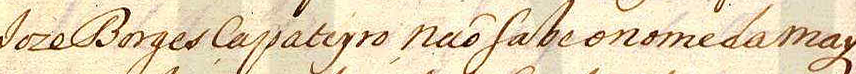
Ioze Borges Çapateyro, naõ sabe o nome da may
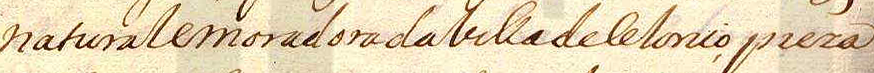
natural e moradora da villa de Celorico, preza
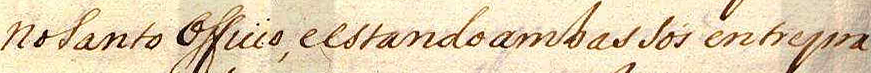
no Santo officio, e estando ambas sós entre pra
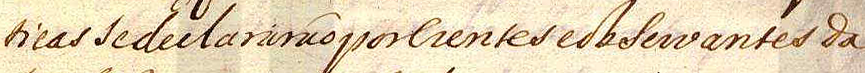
ticas se declararão por crentes e observantes da
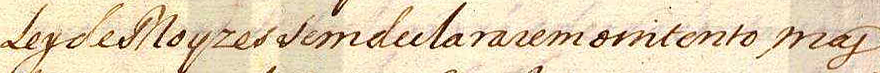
Ley de Moyzes sem declararem o intento mas
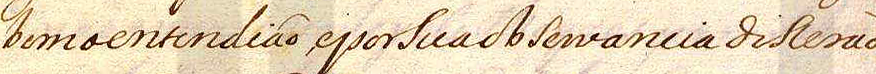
bem o entendiaõ, e por Sua observancia disseraõ
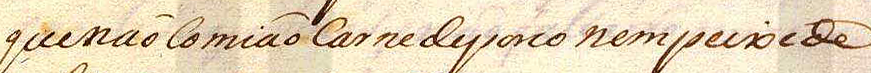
que naõ comião carne de porco nem peixe de
